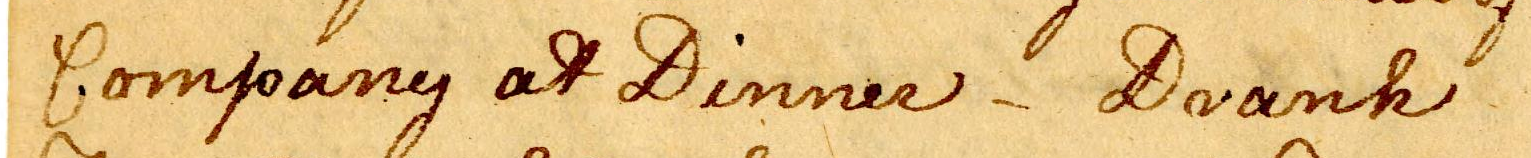Company at Dinner- Drank
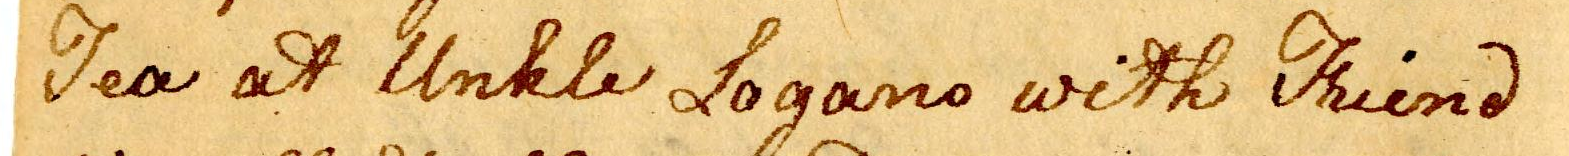Tea at Unkle Logans with Friend
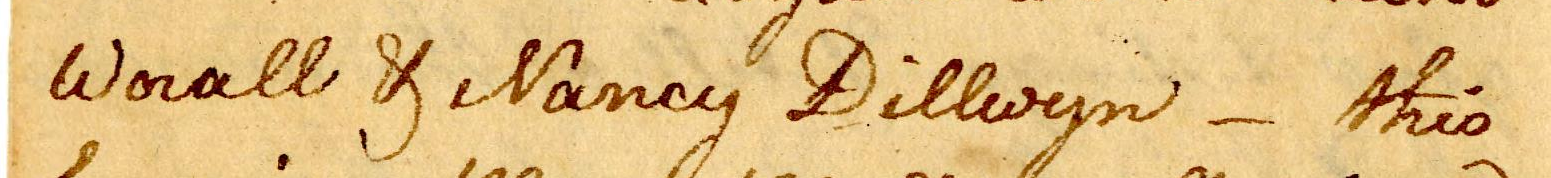Worall & Nancy Dillwyn- this
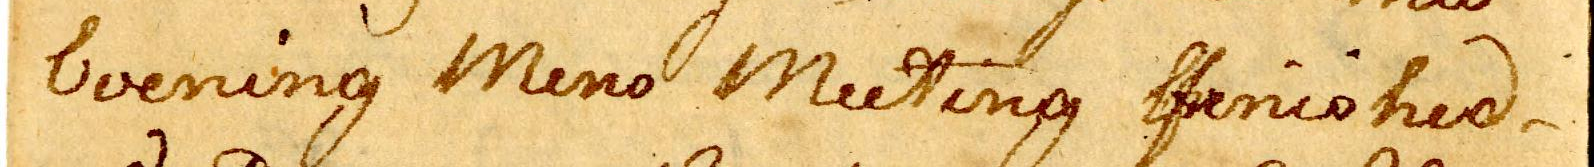Evening Mens Meeting finished-
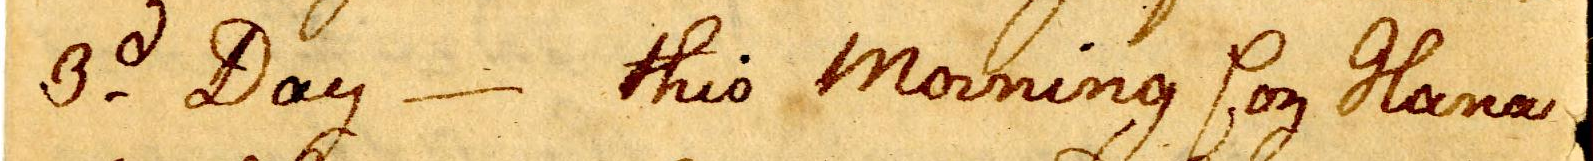3^d. Day- this Morning Coz Hana
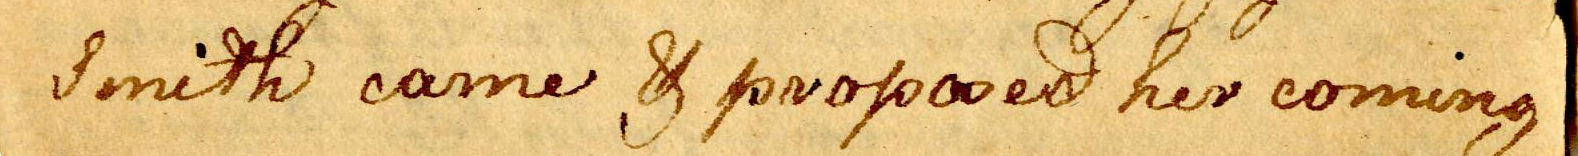Smith came & proposed her coming
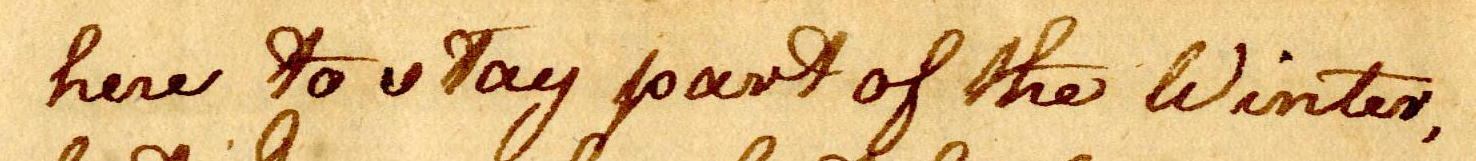here to stay part of the Winter,
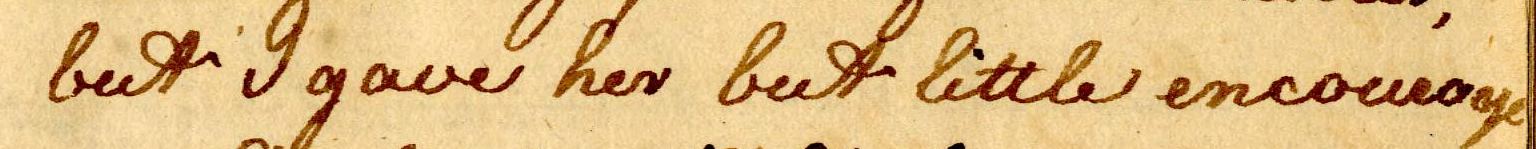but I gave her but little encourage
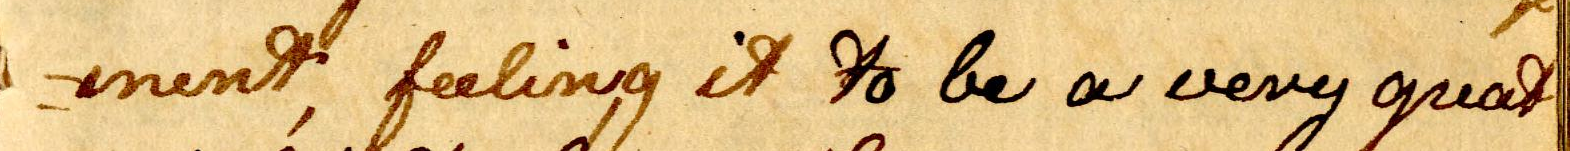-ment, feeling it to be a very great
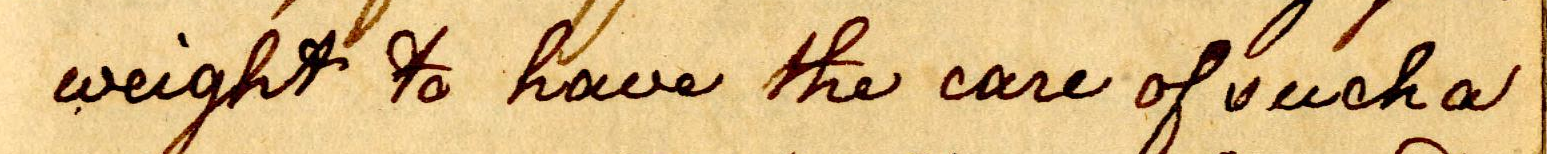weight to have the care of such a
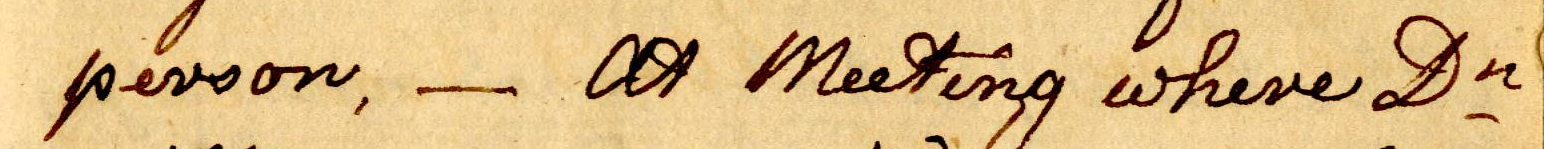person,- At Meeting where D^r
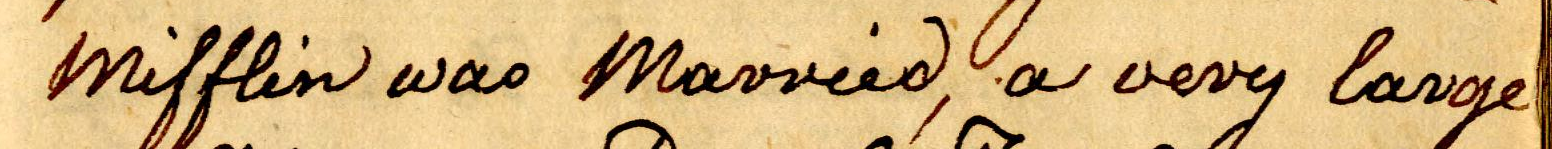Mifflin was Married, a very large
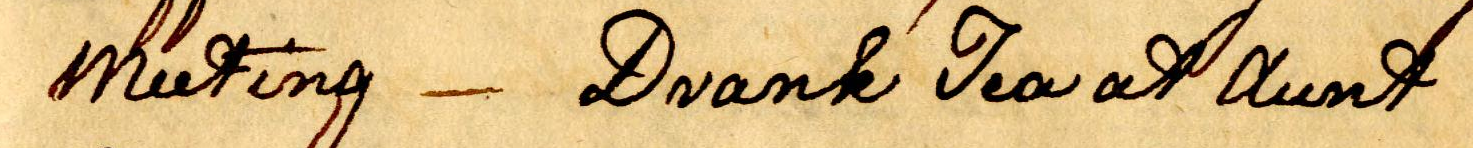Meeting- Drank Tea at Aunt
